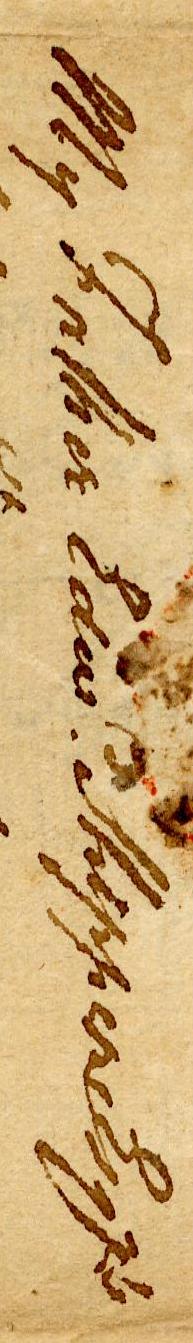My Father Edw^d. Shippen Esq's
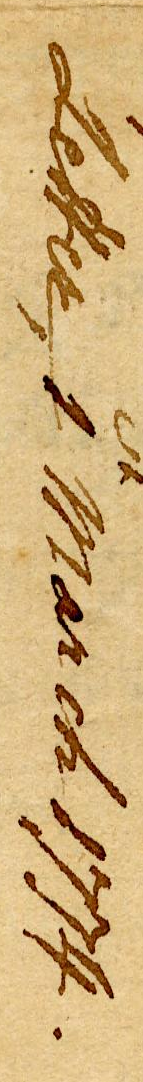Letter, 1^st March 1774.
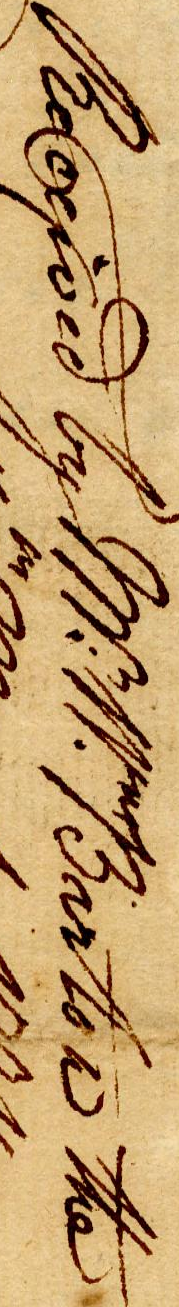Received by M^r. W^m. Barton the
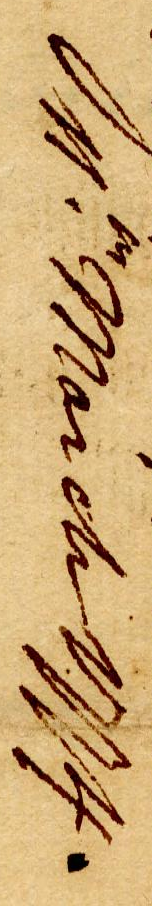11^th March 1774.
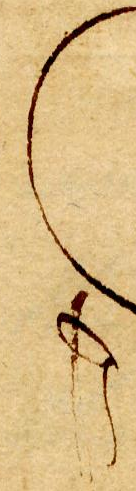To
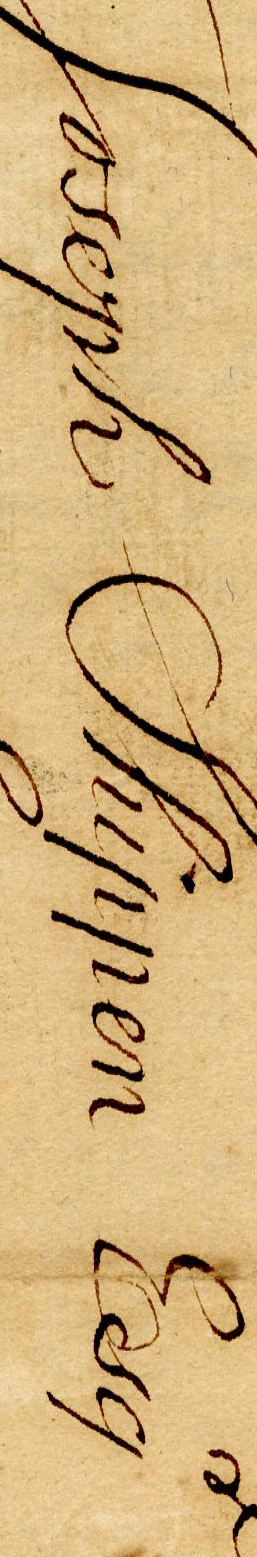Joseph Shippen Esq^r
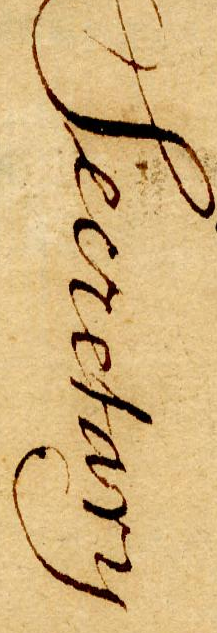Secretary
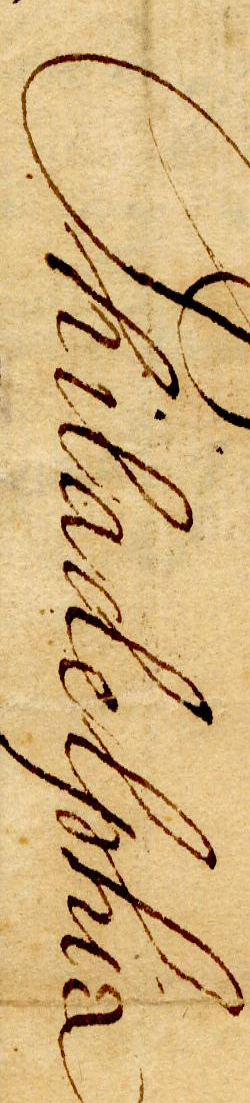Philadelphia
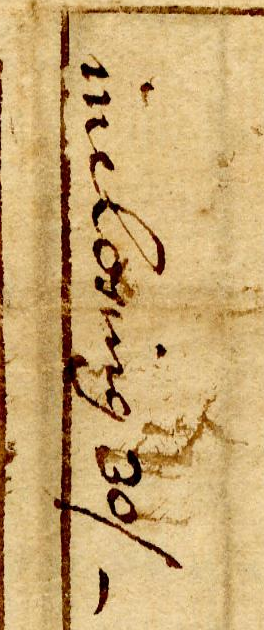inclosing 30s-
